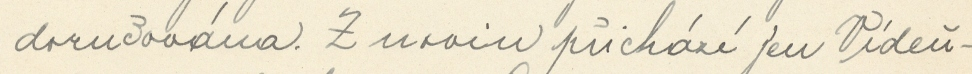doručována. Z novin přichází jen Vídeň-
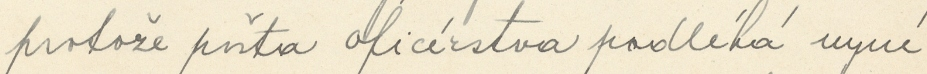protože pošta oficírstva podléhá nyní
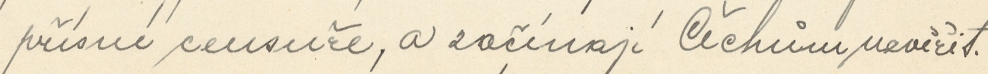přísné censuře, a začínají Čechům nevěřit.
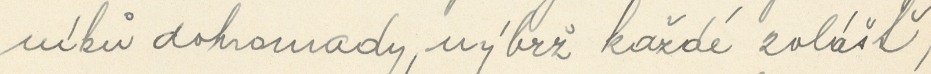níků dohromady, nýbrž každé zvlášť,
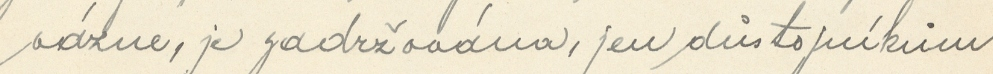vázne, je zadržována, jen důstojníkům
